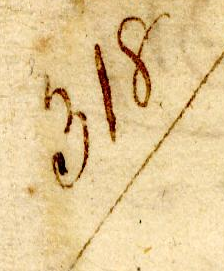318
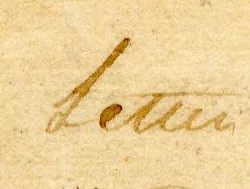Letter
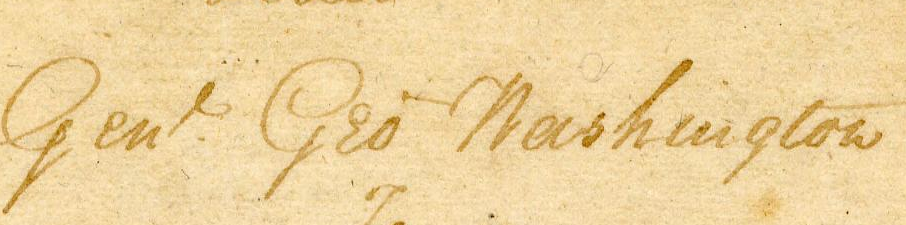Gen^r. Geo Washington
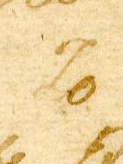To
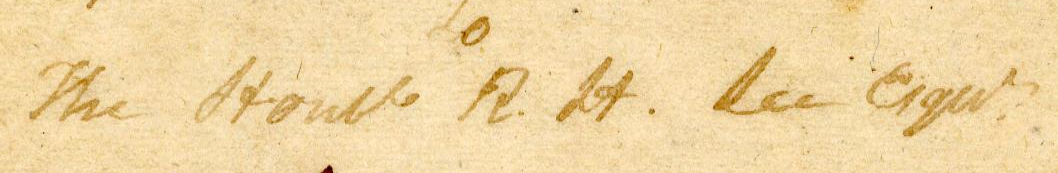The Hou^ble R H. Lee Esq^r.
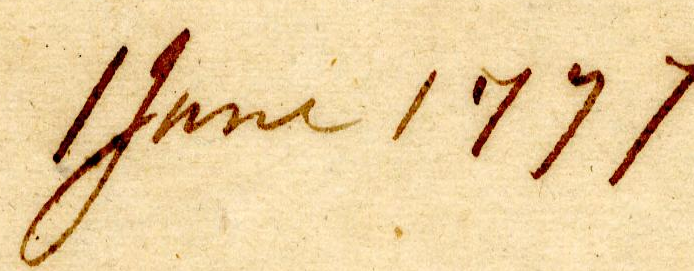1 June 1777
